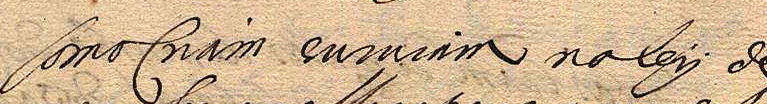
Como Criam e uiuiam na ley de
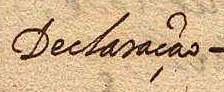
Declaração -
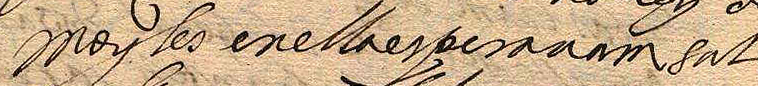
moyses e nella esperauam saL
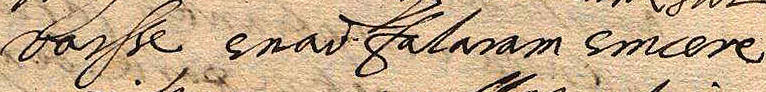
varsse e naõ falaram em cere
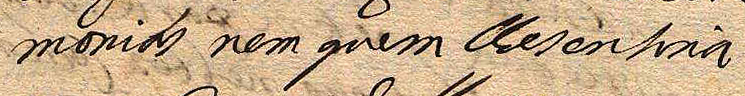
monias nem quem lhes ensina
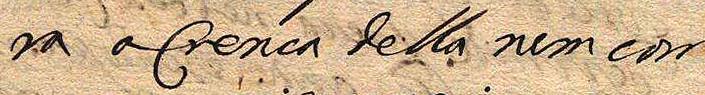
ra a Crença della nem com
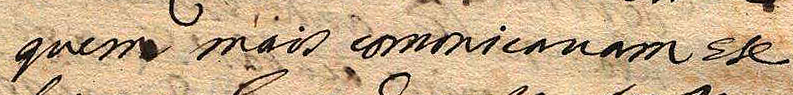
quem mais comonicauam E se
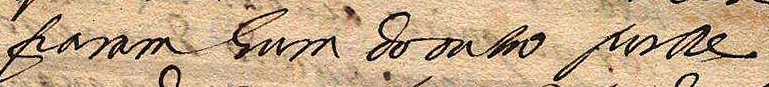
fiaram hum do outro por Re
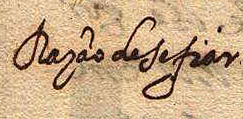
Razão de se fiar.
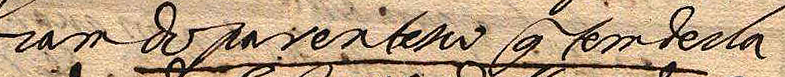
zam do parentesco q̄ tem decla
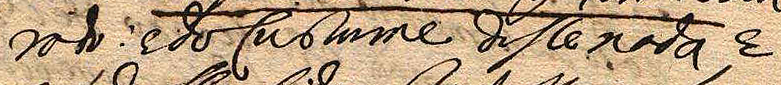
rado. E do Custume disse nada E
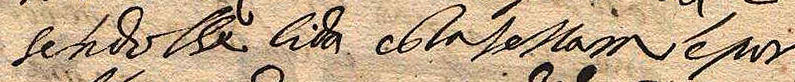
sendolhe lida esta sessam e por
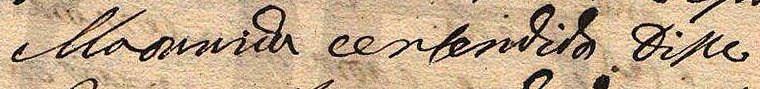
ella ouuida e entendida Disse
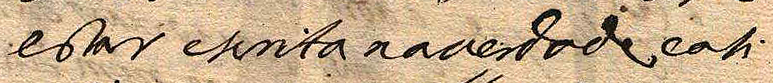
estar escrita na uerdade e asi
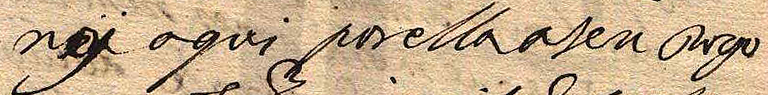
ney aqui por ella a seu Rogo
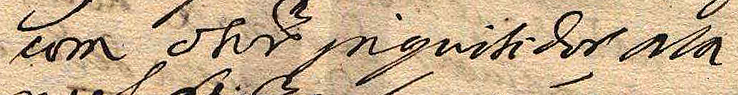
com o sor̄ jnquisidor Ma
